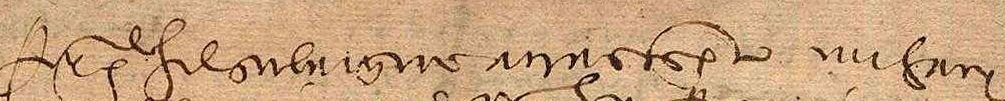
foy pdo ho desenbarguo atras esp̄to em ha cy
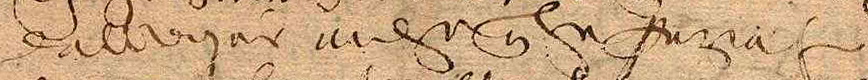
dade devora ē audja q̄ hi fazia ho
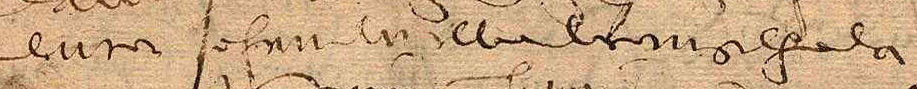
doutor Joham de mello do comselho da
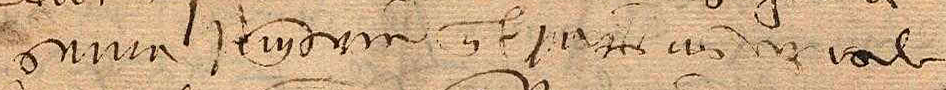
santa Jmq̄syçā q̄ hora tē as vezes de
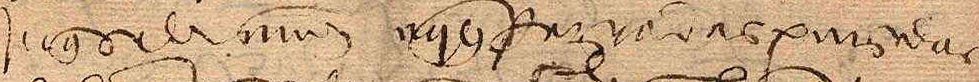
Jnq̄sydor moor a q̄ll fazya ē as pousadas
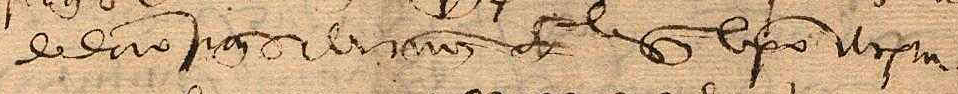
do dito Jnq̄sydor mor o Rdo s̄or bpō de cepta
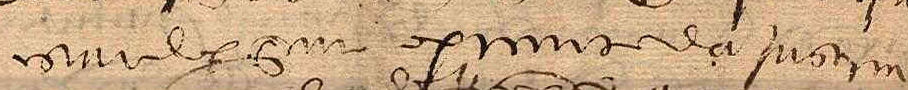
estando ꝑsente o promotor da Justyça
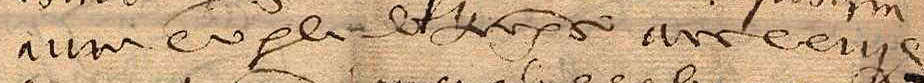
autor e o ꝑdor do Reo p̄so aos xxiij dj
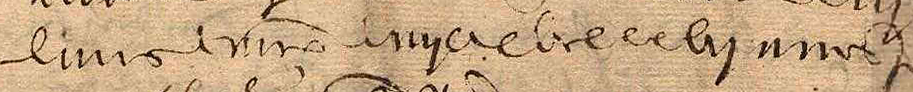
do mes de m̄ço de mjll e bc xxxbij anos Jor
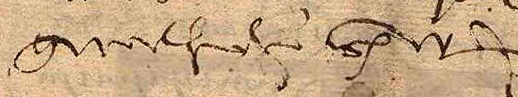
ge coelho ho esp̄vy
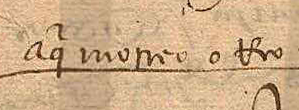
aqi morreo o Reo
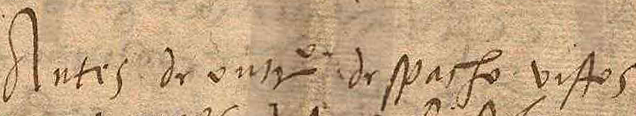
Antes de outro despacho vistos
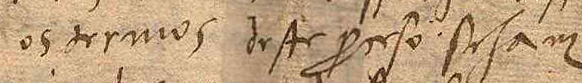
os termos deste ꝓceso seJam
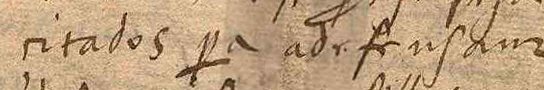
citados ꝑa a defensam
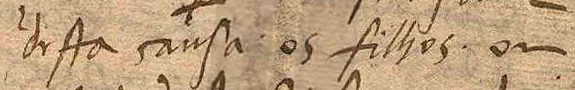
desta causa os filhos ou
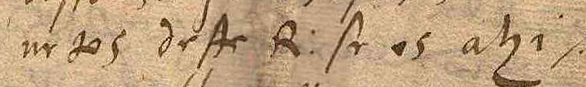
netos deste R. se os ahi
